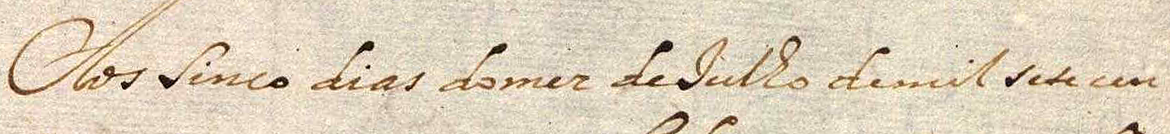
Aos sinco dias do mez de Iulho de mil setecen
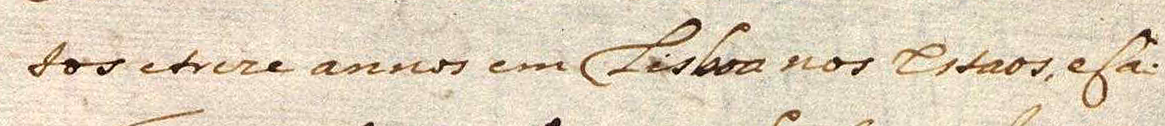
tos e treze annos em Lisboa nos Estaos, e Ca
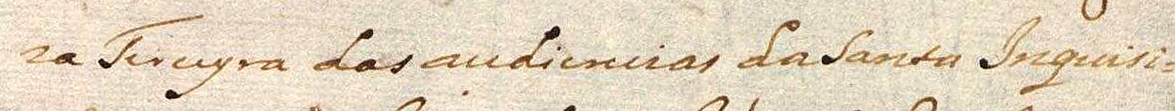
za Terceyra das audiencias da Santa Inquisi
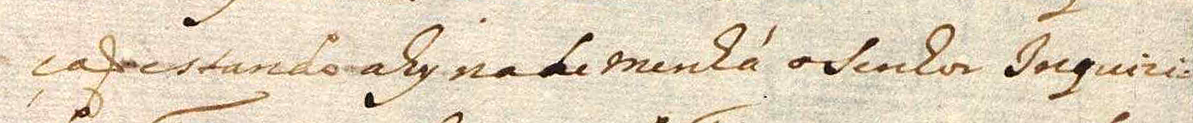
çaõ estando ahy na de menhã o Senhor Inquizi
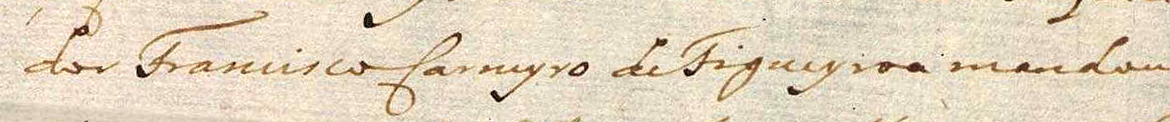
dor Francisco Carneyro de Figueyroa mandou
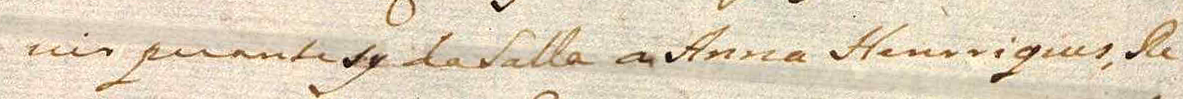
uir perante sy da Salla a Anna Henrriques, Re
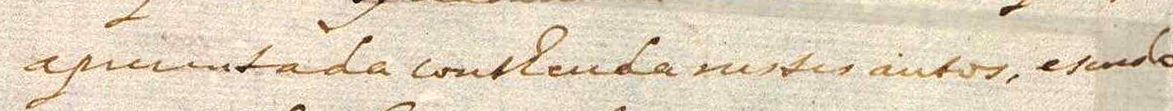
aprezentada contheuda nestes autos, e sendo
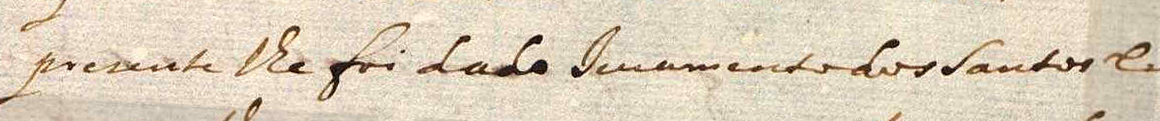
prezente lhe foi dado Iuramento dos santos E
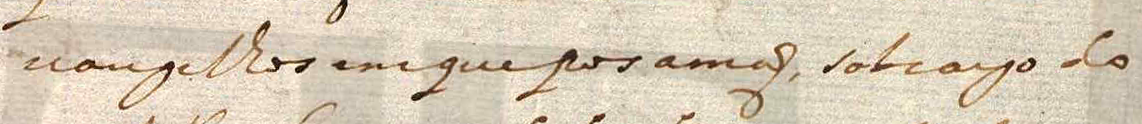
uangelhos em que pos a maõ, sob cargo do
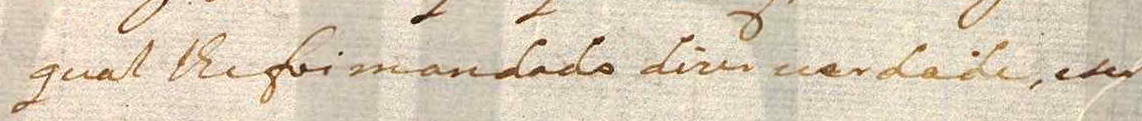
qual lhe foi mandado dizer uerdade, e ter
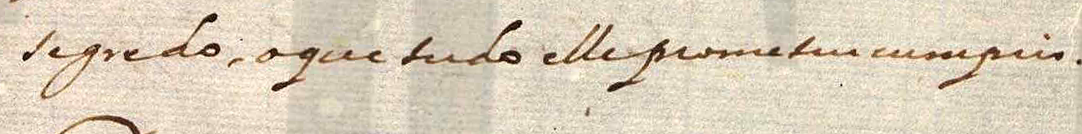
segredo, o que tudo elle prometeu cumprir.
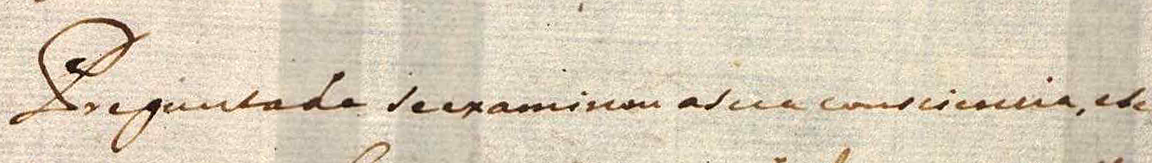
Preguntada se examinou a sua consciencia, e se
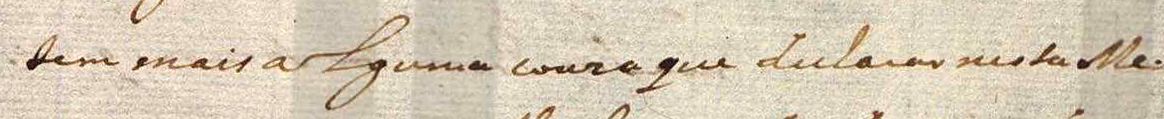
tem mais alguma couza que declarar nesta Me
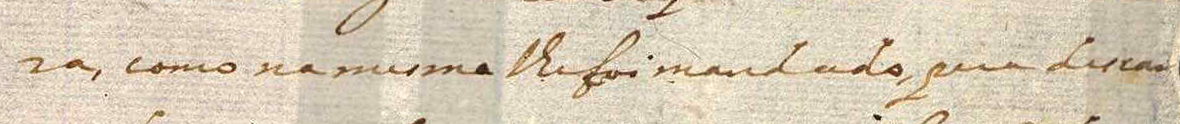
za, como na mesma lhe foi mandado, pera descar
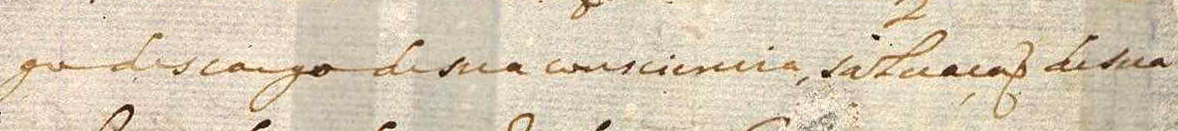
go descargo de sua consciencia, saluaçaõ de sua
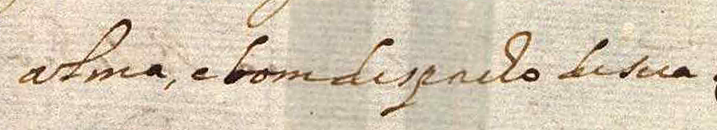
alma, e bom despacho de sua
